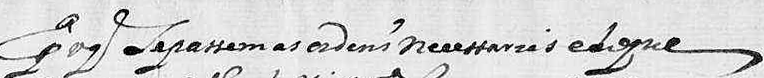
pa o q̄ se passem as ordens necessarias e do que
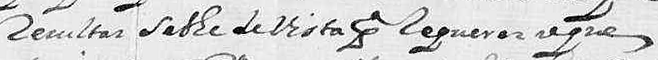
Resultar se lhe de vista pa Requerer o que
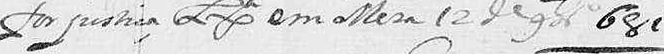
for justiça, Lxa em Meza 12 de 9bro 68i
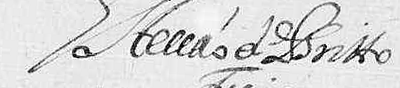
Esteuaõ de Britto
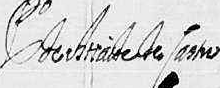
Po de Attaide de Castro.
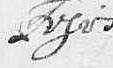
Foyos
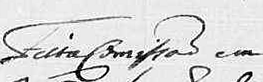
Feita Comissaõ em
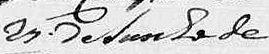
27. de Iunho de
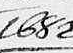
1682.
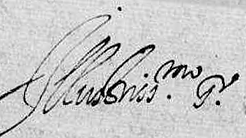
Jllustriss.mo s.r
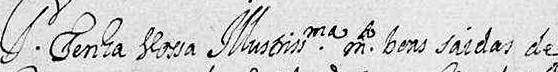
P.o Tenha Vossa Illustriss.ma mto. boas saidas de
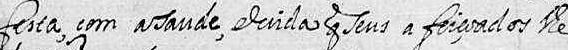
festa, com a saude, e uida q̄ seus afeiçoados lhe
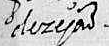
dezejaõ
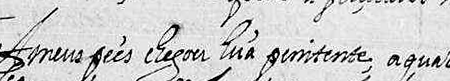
A meus peés chegou huā penitente, a qual
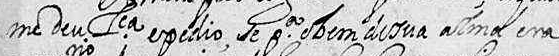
me deu Lc.a e pedio, se p.a o bem de sua alma era
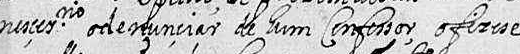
nescer.rio o denunciar de hum Confessor, o fizese
